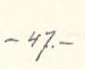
47
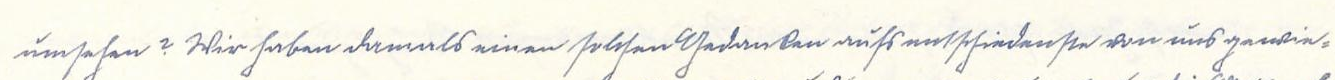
umsehen? Wir haben damals einen solchen Gedanken aufs entschiedenste von uns gewie-
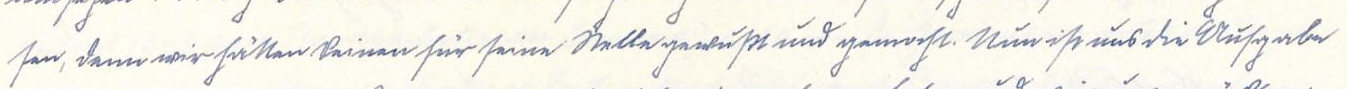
wiesen, denn wir hätten keinen für seine Stelle gewusst und gemocht. Nun ist uns die Aufgabe
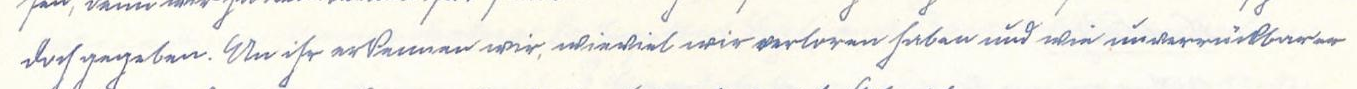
doch gegeben. An ihr erkennen wir, wieviel wir verloren haben und wie unverrückbar er
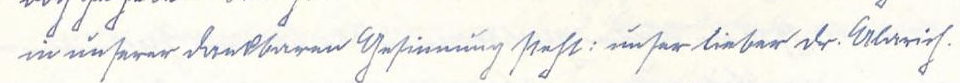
in unserer dankbaren Gesinnung steht: unser lieber Dr. Alarich!
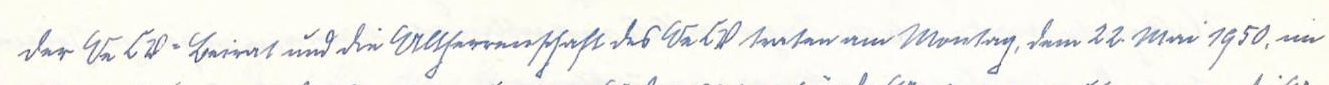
Der OeCV und die Altherrenschaft des OeCV traten am Montag, dem 2. Mai 1950, im
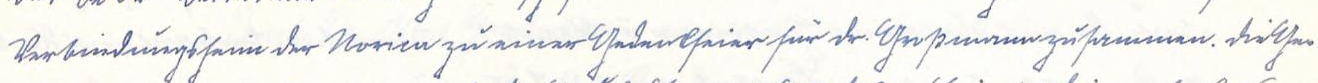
Verbindungsheim der Norica kann zu einer Gedenkfeier für Dr. Großmann zusammen. Die Ge-
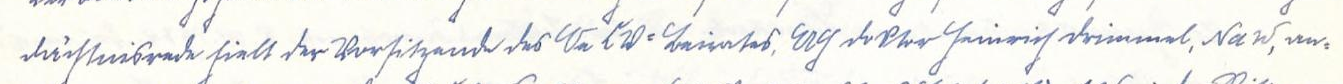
dächtnisrede hielt der Vorsitzende des OeCV-Beirates, AH Dr. Heinrich Drimmel, NaW, an-
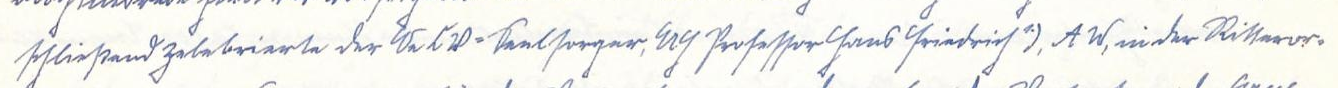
anschließend zelebrierte der OeCV-Seelsorger AH Professor Hans Friedrich 1), AW, in der Ritteror-
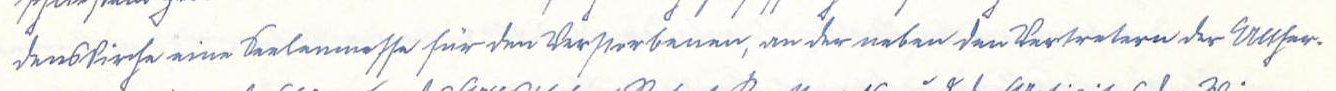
denskirche eine Seelenmesse für den Verstorbenen, an der neben den Vertretern der Alther-
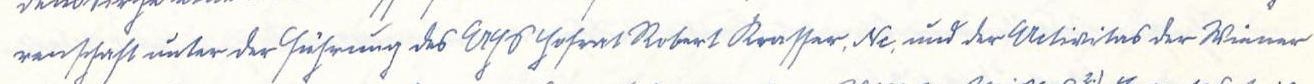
renschaft unter der Führung der AHS Hofrat Robert Krasser,, Nc, und der Aktivitas der Wiener
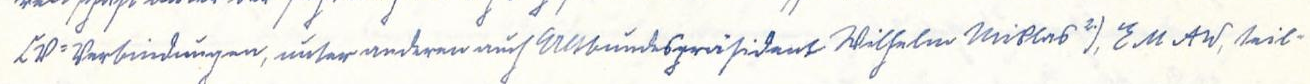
CV-Verbindungen, unter anderen auch Altbundespräsident Wilhelm Miklas, EMAW, teil-
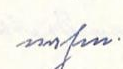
nahm.
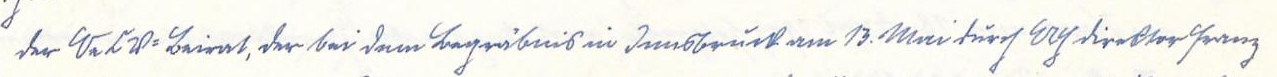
Der OeCV-Beirat, der bei dem Begräbnis in Innsbruck am 13. Mai durch AH Direktor Franz
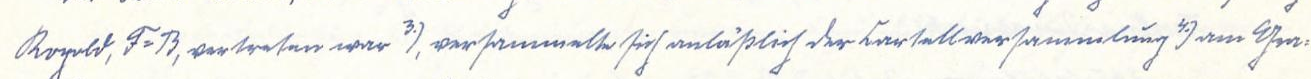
Ropold, F-B, vertreten war 3) versammelte sich anlässlich der Cartellversammlung 4) am Gra-
